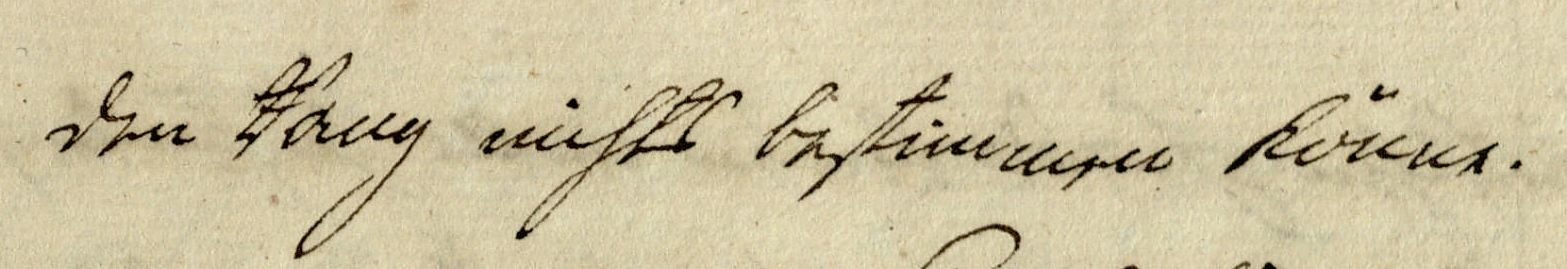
den Rang nichts bestimmen könne.
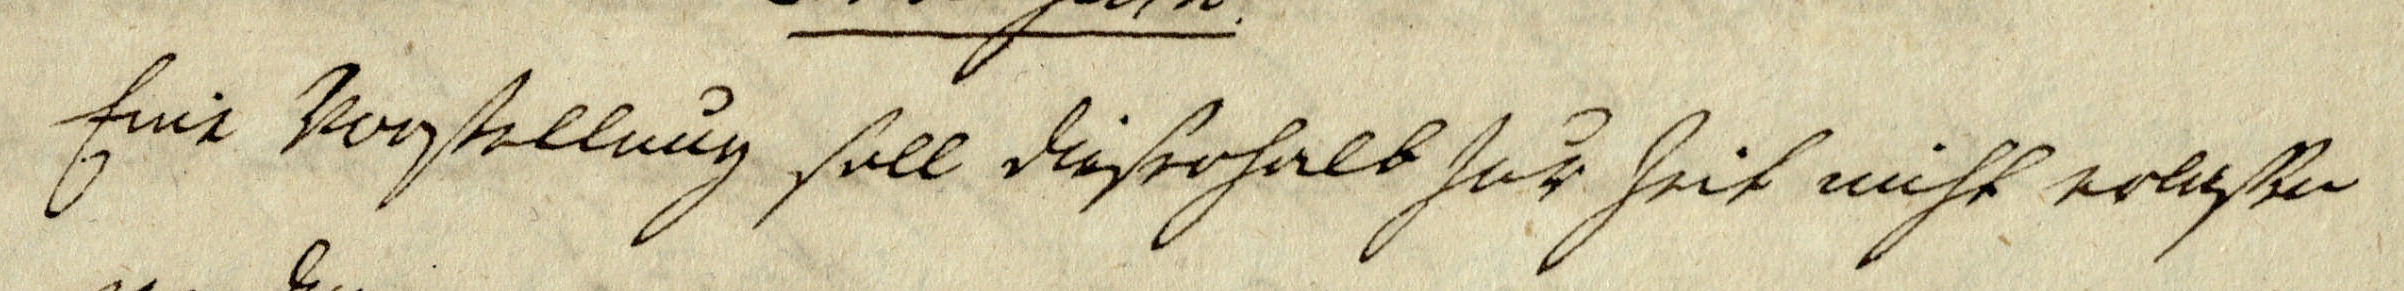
Eine Vorstellung soll dieserhalb zur Zeit nicht erlassen
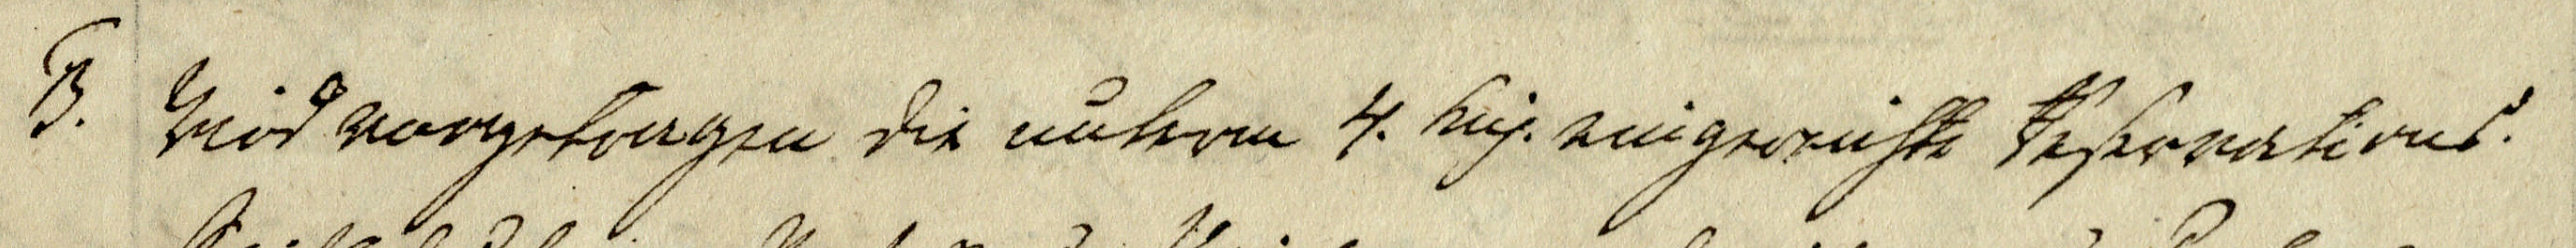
3. Wird vorgetragen die unterm 4. huj. eingereichte Reservations¬
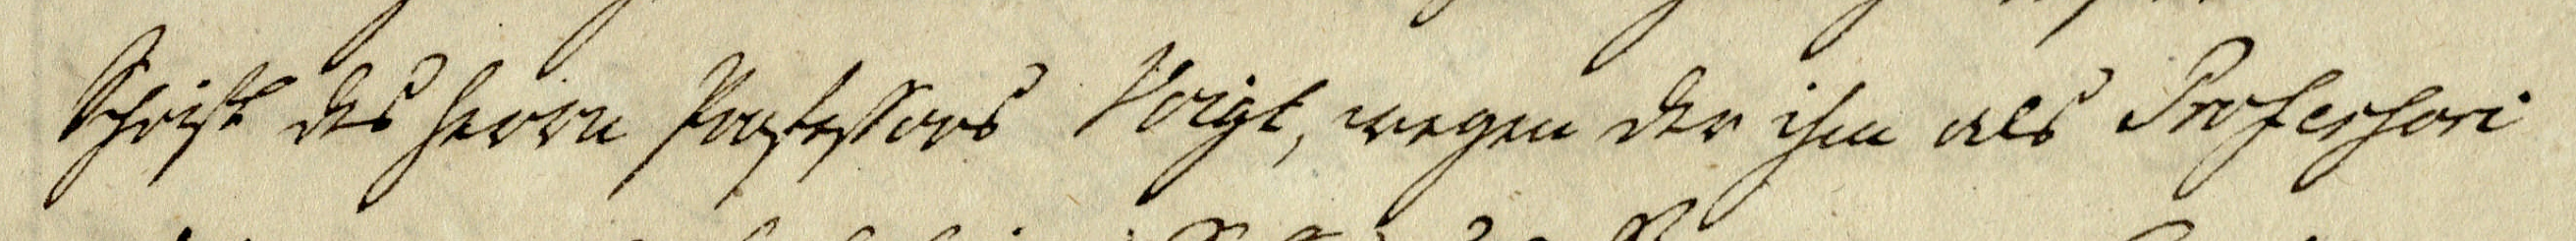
Schrift des Herrn Professors Voigt, wegen der ihm als Professori
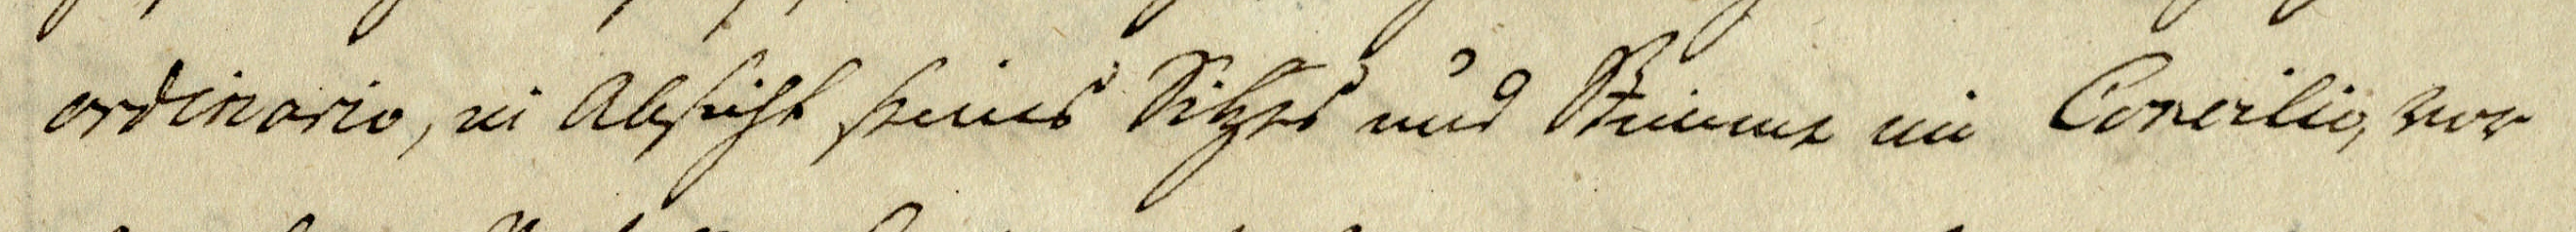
ordinario, in Absicht seines Sitzes und Stimme im Concilii, vor
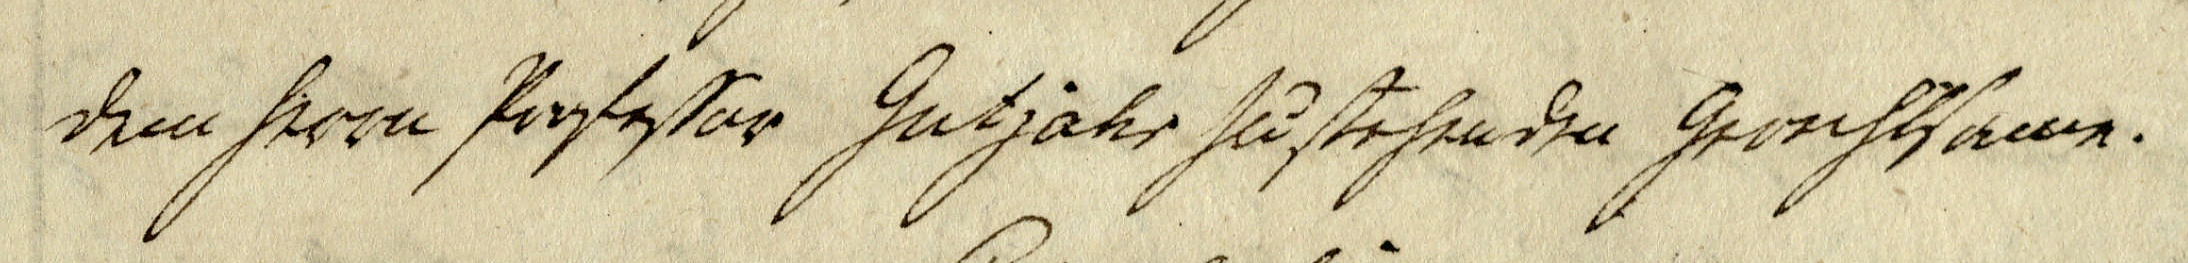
dem Herrn Professor Gutjahr zustehenden Gerechtsame.
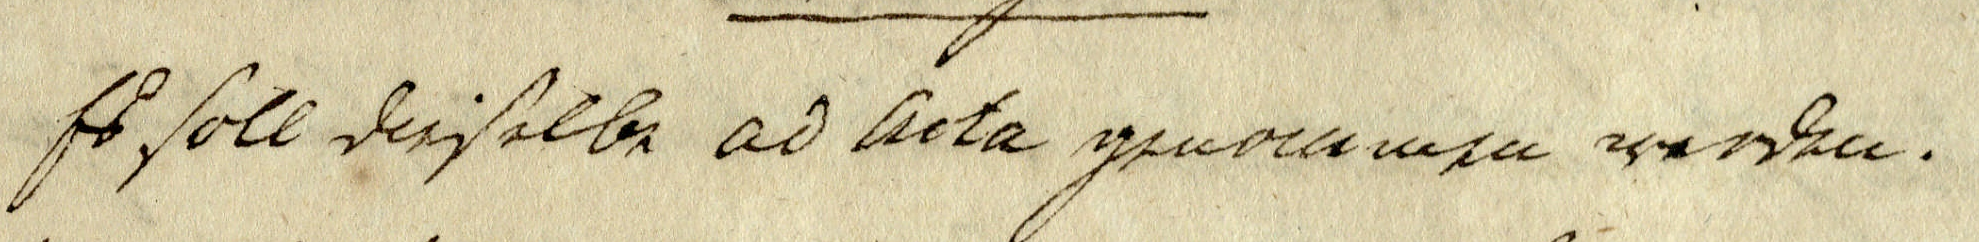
Es soll dieselbe ad Acta genommen werden.
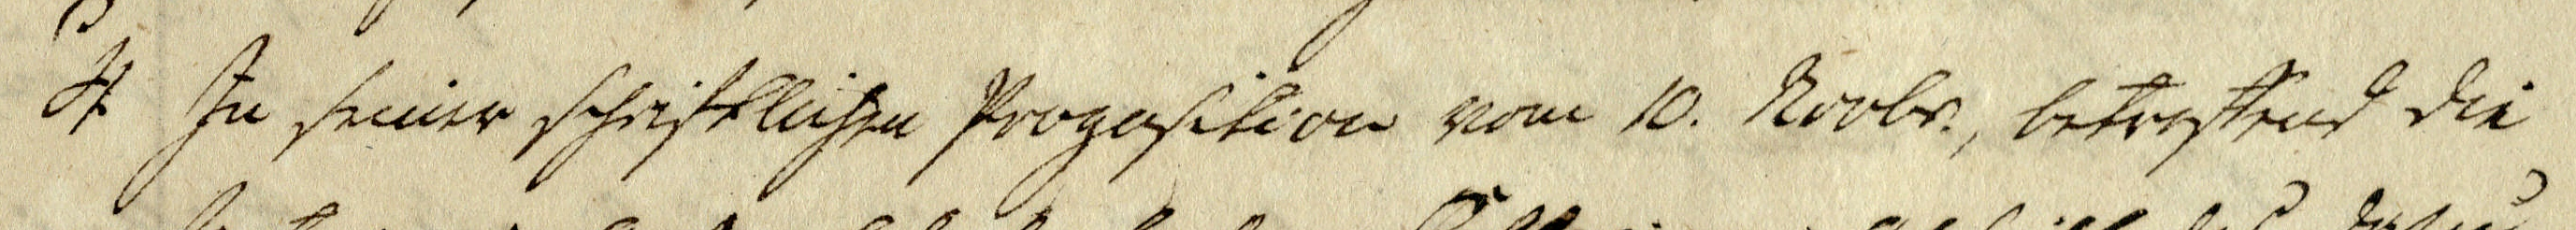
4. In seiner schriftlichen Proposition vom 10. Novbr., betreffend die
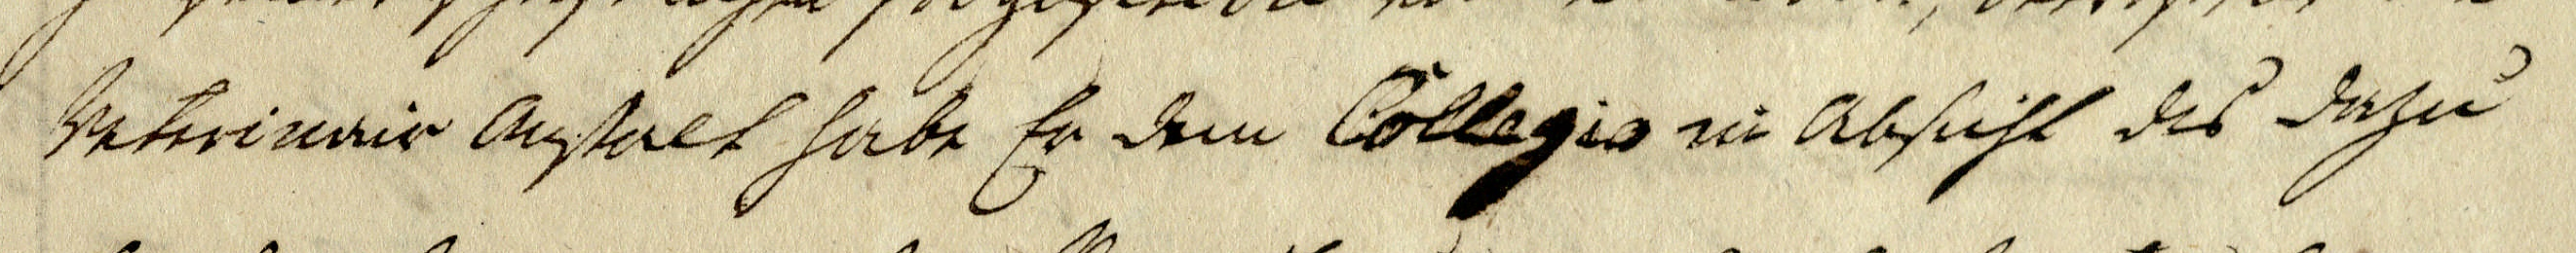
Veterinair Anstalt habe Er dem Collegio in Absicht des dazu
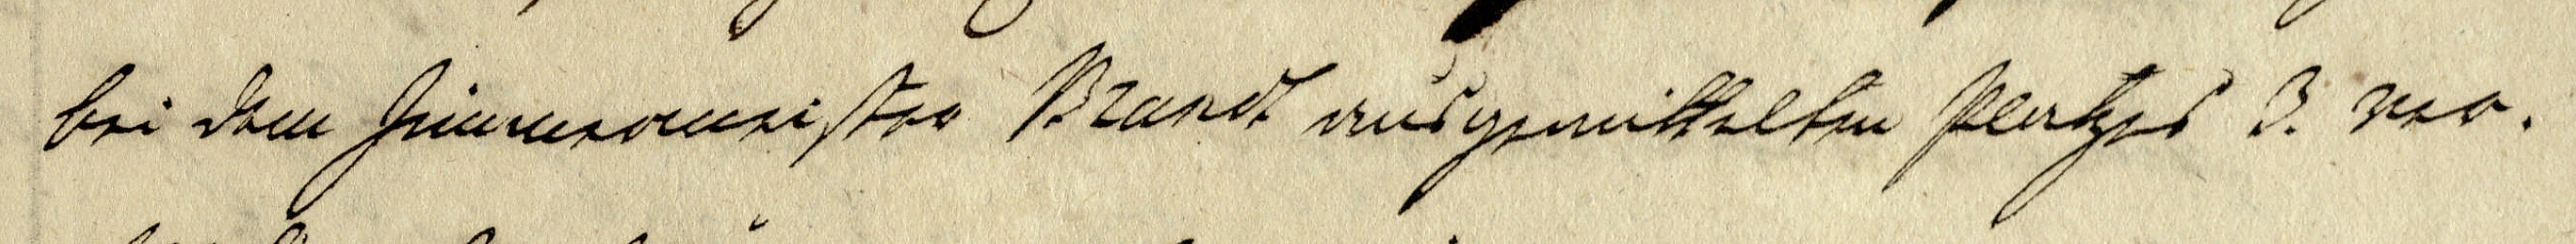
bei dem Zimmermeister Brandt ausgemittelten Platzes 3. ver¬
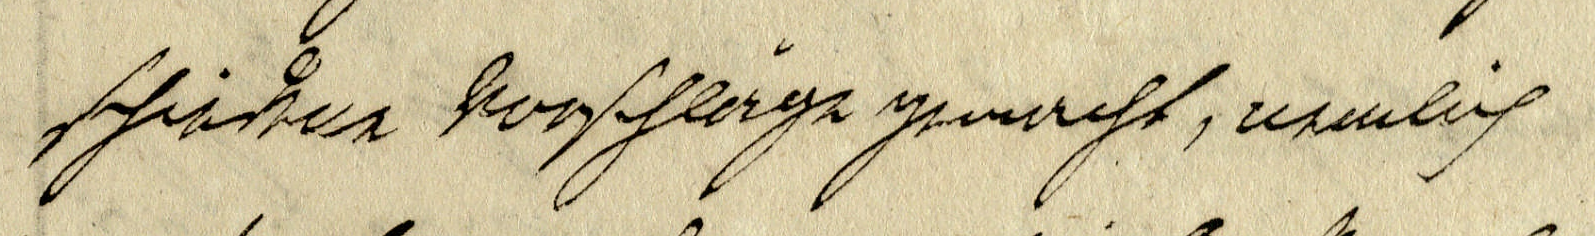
schiedene Vorschläge gemacht, nemlich
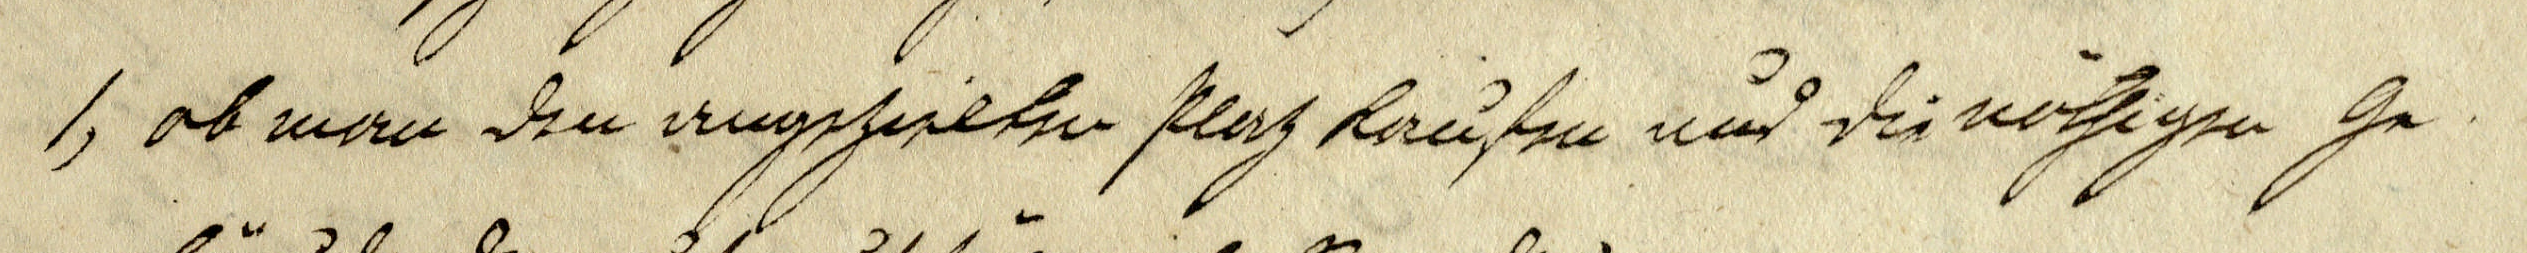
1, ob man den angezielten Platz kaufen und die nöthigen Ge¬
